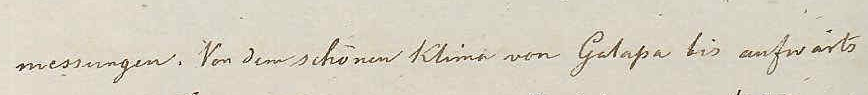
messungen. Von dem schönen Klima von Galapa bis aufwärts
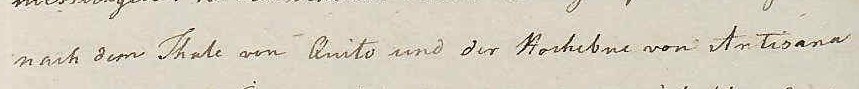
nach dem Thale von Quito und der Hochebne von Antisana
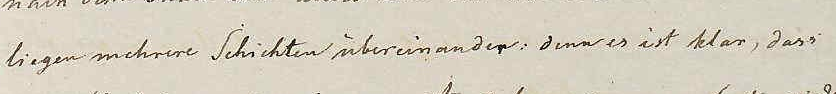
liegen mehrere Schichten übereinander: denn es ist klar, dass
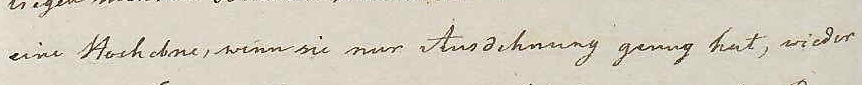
eine Hochebne, wenn sie nur Ausdehnung genug hat, wieder
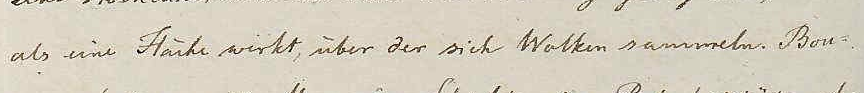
als eine Fläche wirkt, über der sich Wolken sammeln. Bou-
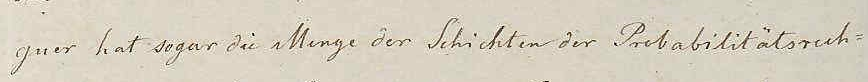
guer hat sogar die Menge der Schichten der Probabilitätsrech-
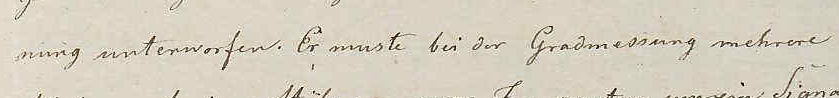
nung unterworfen. Er muste bei der Gradmessung mehrere
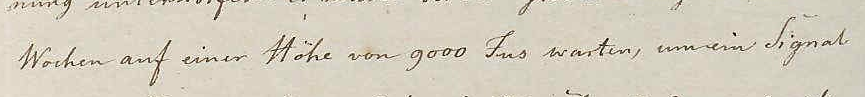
Wochen auf einer Höhe von 9000 Fus warten, um ein Signal
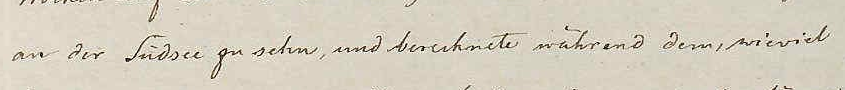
an der Südsee zu sehn, und berechnete während dem, wieviel
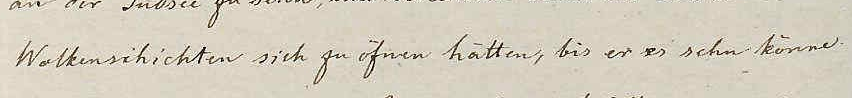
Wolkenschichten sich zu öfnen hätten, bis er es sehn könne.
